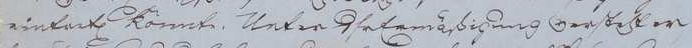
eintreten könnte. Unter dsr Ermäßigung versteht er
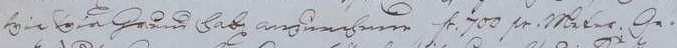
wie wir Grund haben anzunehmen, fr.700 pr. Meter. Ge-
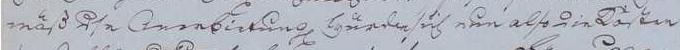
mäß dsn Anerbietungen würden sich nun also die Kosten
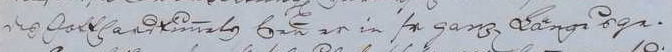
des Gotthardtunnels, wenn er in sr ganzen Länge ausge-
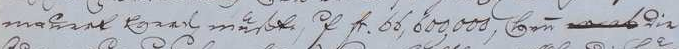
mauert werden müßte, auf fr. 66,600,000, wenn er ab die
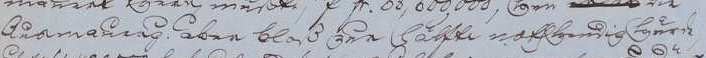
Ausmauerg. aber bloß zur Hälfte nothwendig würde,
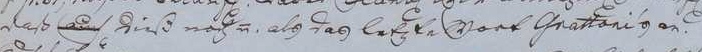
daß auch dieß noch n. als das letzte Wort Grattoni's an-
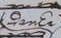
wiederholthen
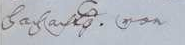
Hochachtung von
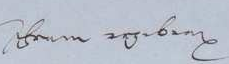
Ihrem ergebenen
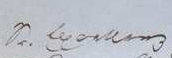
Sr. Excellenz
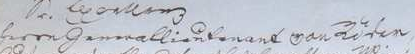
Herrn Generallieutenant von Röder,
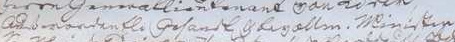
Außerordentl. Gesandter & bevollm. Minister
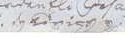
des Norddeutschen
